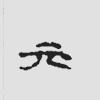亓（其）
